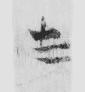十二
